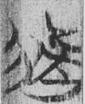逨
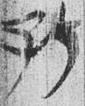孤
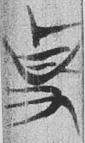史（使）
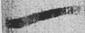一
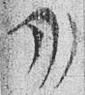介
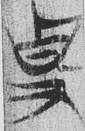史（使）
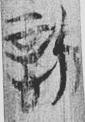○（親）
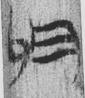於
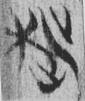桃
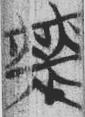○（勞）
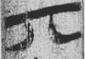亓（其）
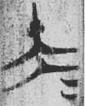大
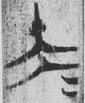夫
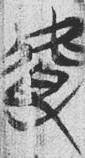○（且）
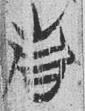青（請）
